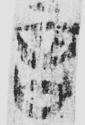言
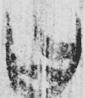曰
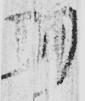多
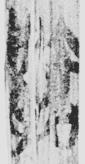○（鮑）
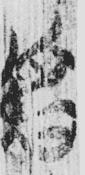○（叔）
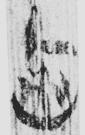○（牙）
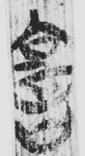○（答）
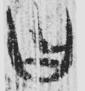曰
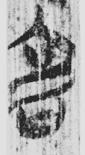害
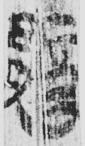𨟻（將）
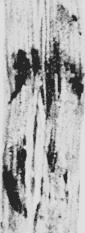○（來）
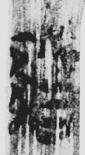𨟻
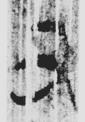又（有）
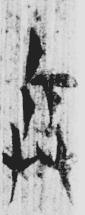兵
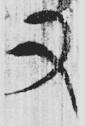又（有）
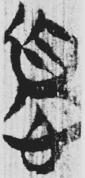○（憂）
